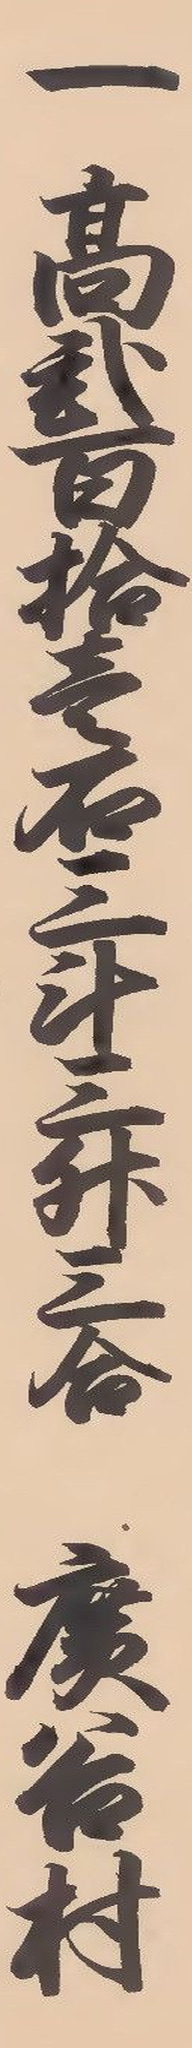一高弐百拾壱石三斗三升三合広谷村
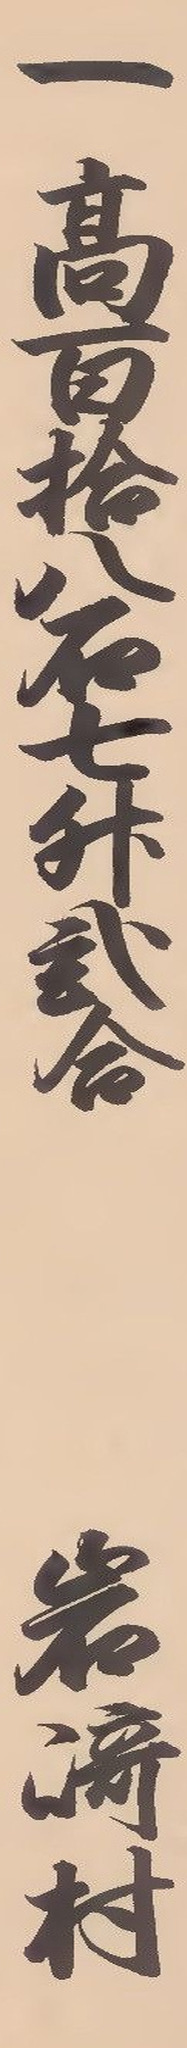一高百拾八石七升弐合岩崎村
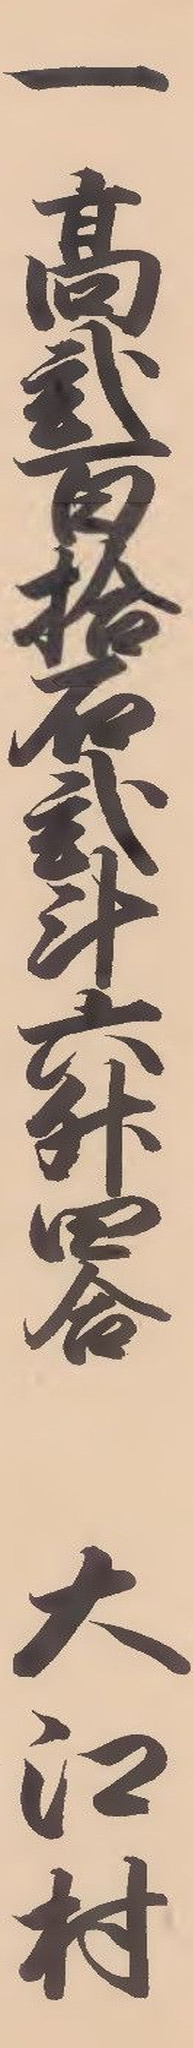一高弐百拾石弐斗六升四合大江村
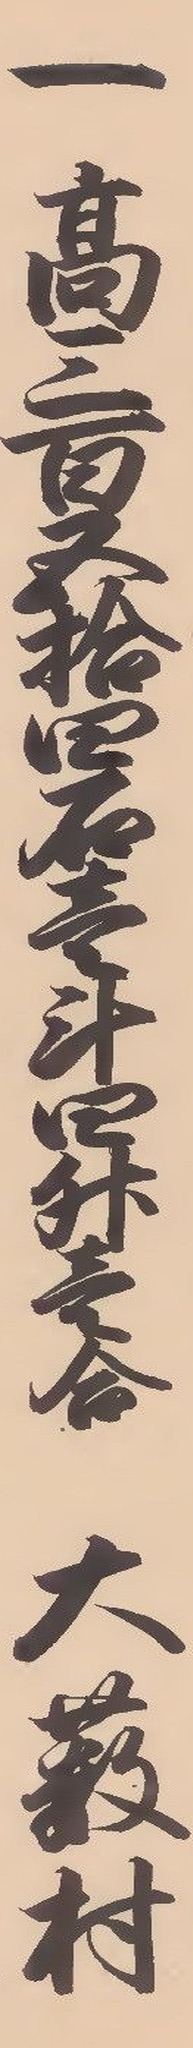一高三百五拾四石壱斗四升壱合大藪村
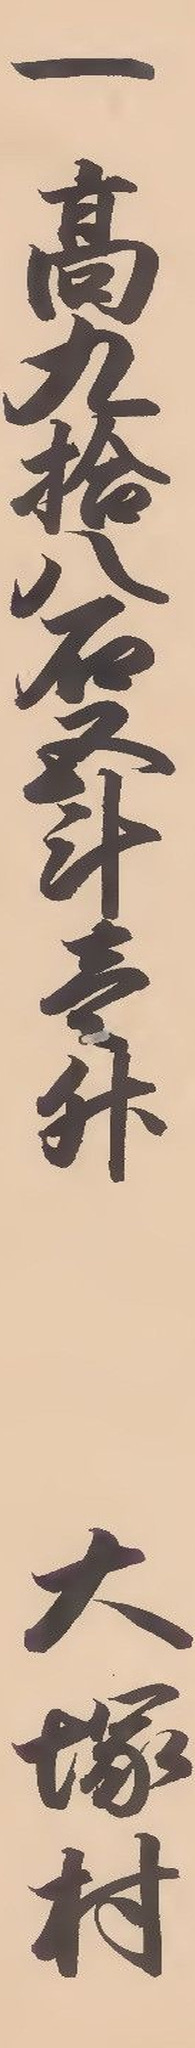一高九拾八石五斗壱升大塚村

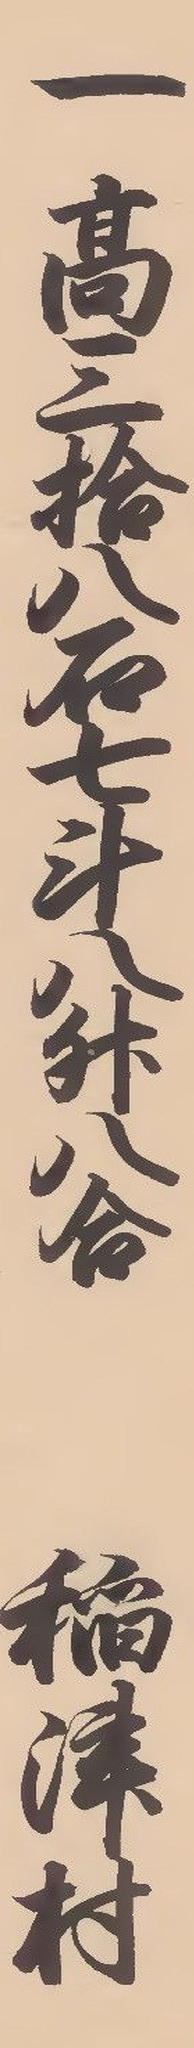一高三拾八石七斗八升八合稲津村
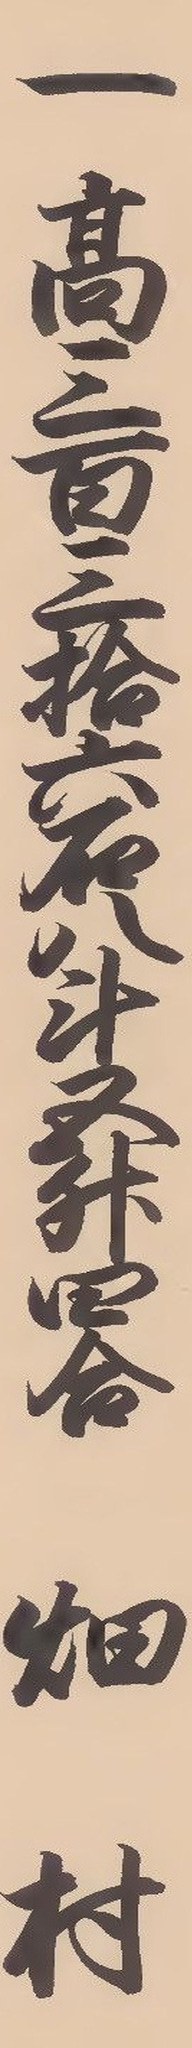一高三百三拾六石八斗五升四合畑村
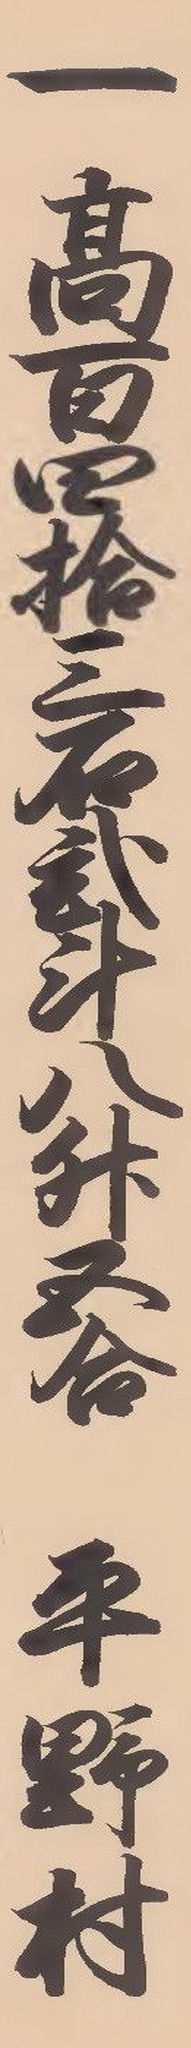一高百四拾三石弐斗八升五合平野村
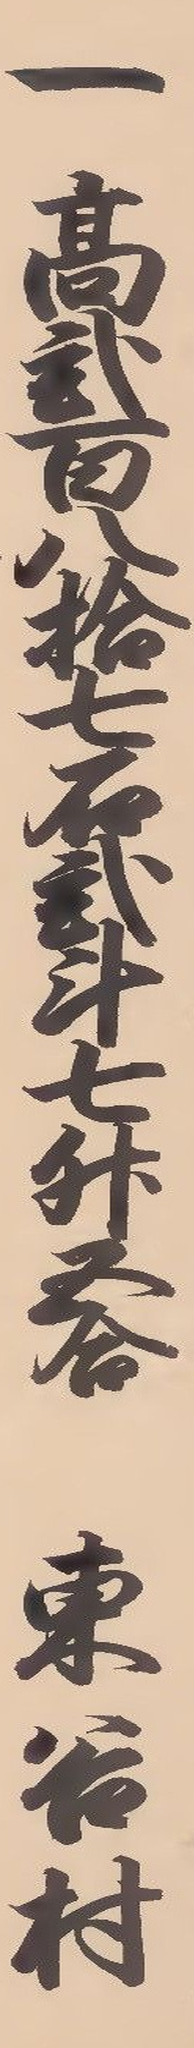一高弐百八拾七石弐斗七升五合東谷村
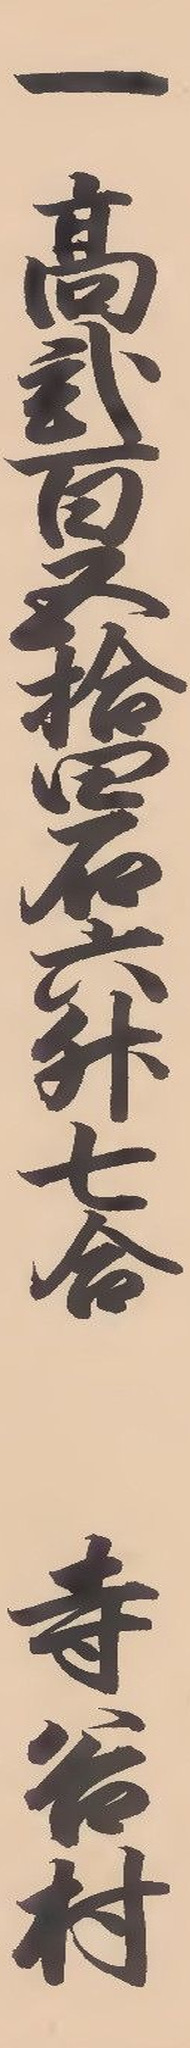一高弐百五拾四石六升七合寺谷村
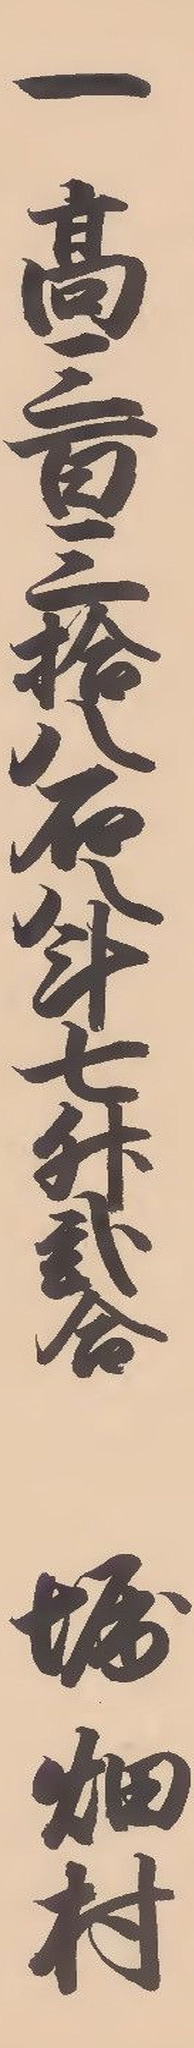一高三百三拾八石八斗七升弐合堀畑村

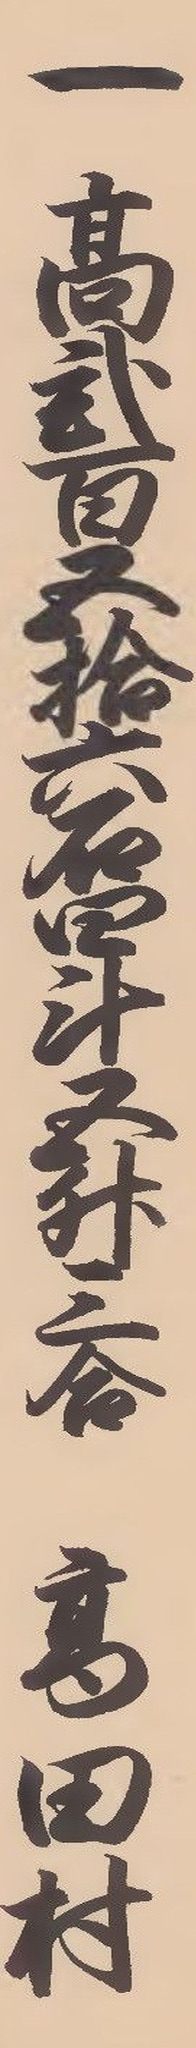一高弐百五拾六石四斗五升三合高田村
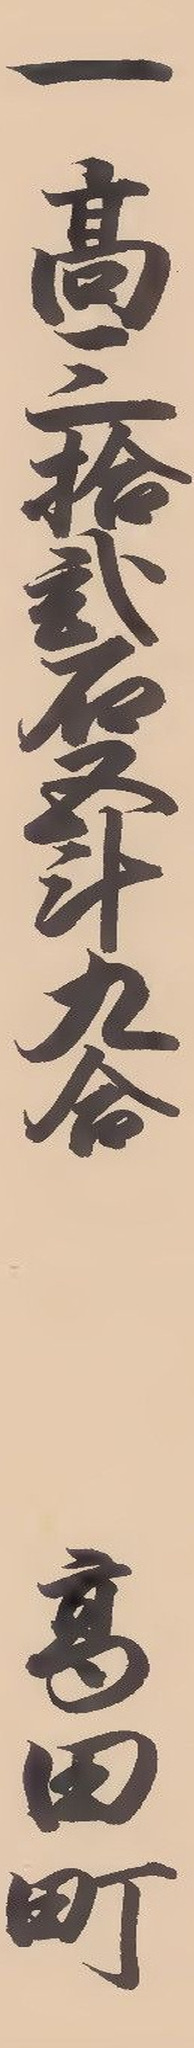一高三拾弐石五斗九合高田町
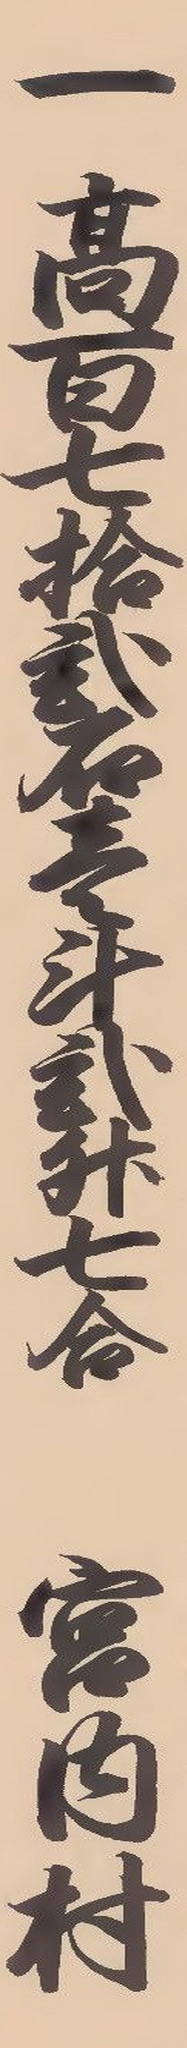一高百七拾弐石壱斗弐升七合宮内村
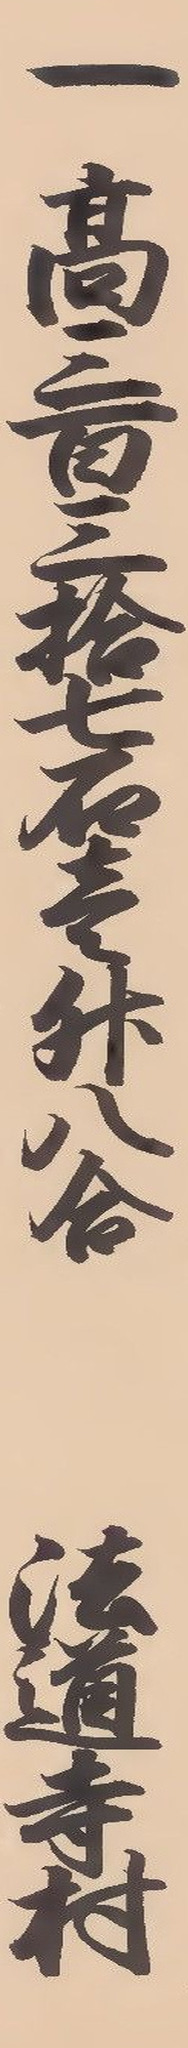一高三百三拾七石壱升八合法道寺村
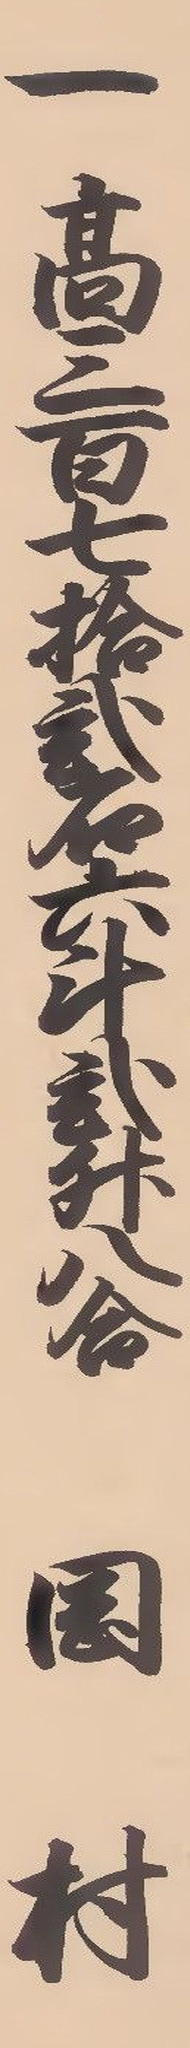一高三百七拾弐石六斗弐升八合岡村
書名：但馬国郷帳
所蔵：国立公文書館 National Archives of Japan
